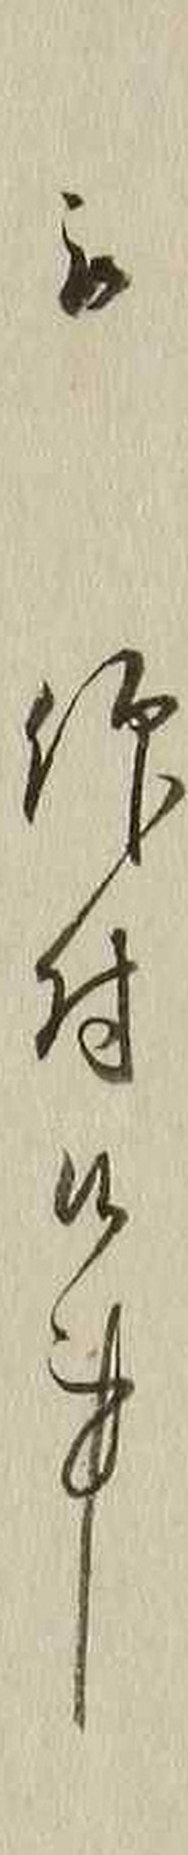被仰付候事
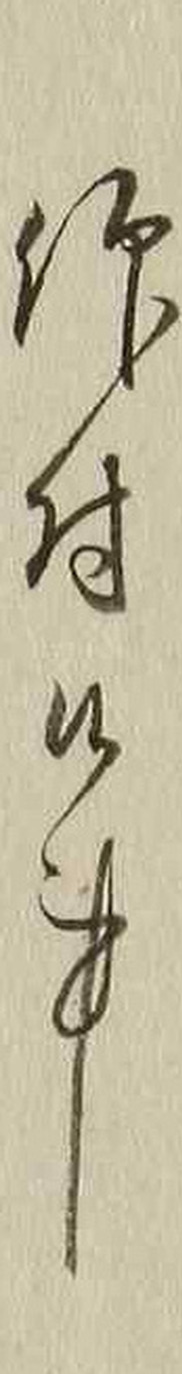被仰付候事
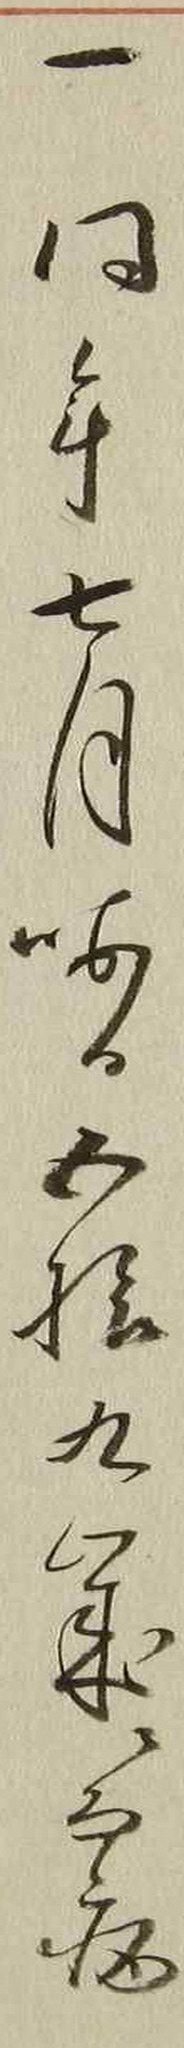一同年七月晦日五拾九歳ニ而病
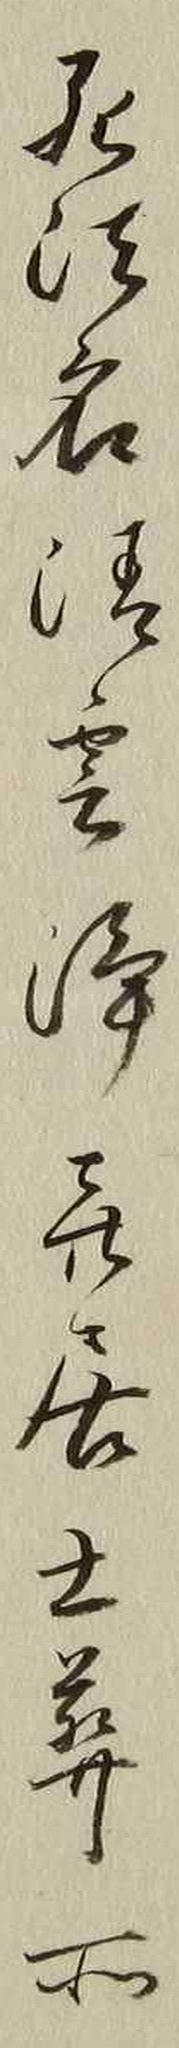死法名清雲浄喜居士葬所
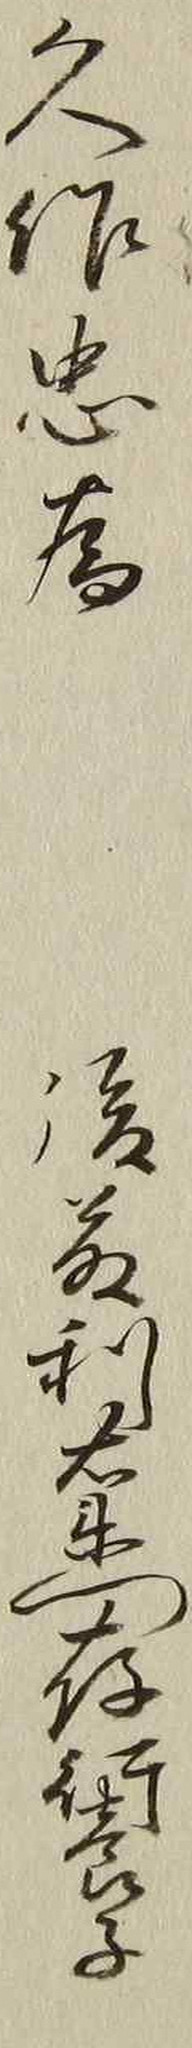久作忠為後藤利右衛門存行養子
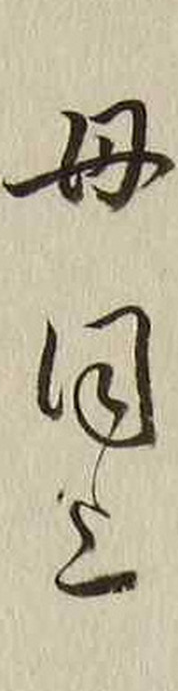母同上
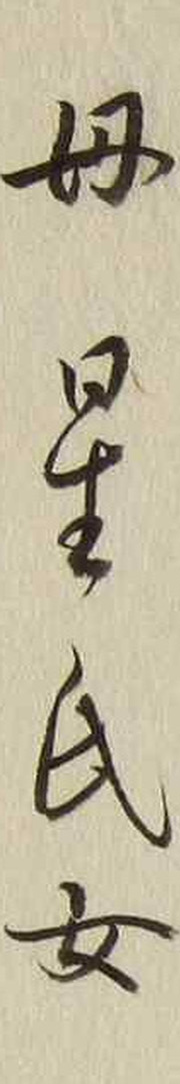母星氏女

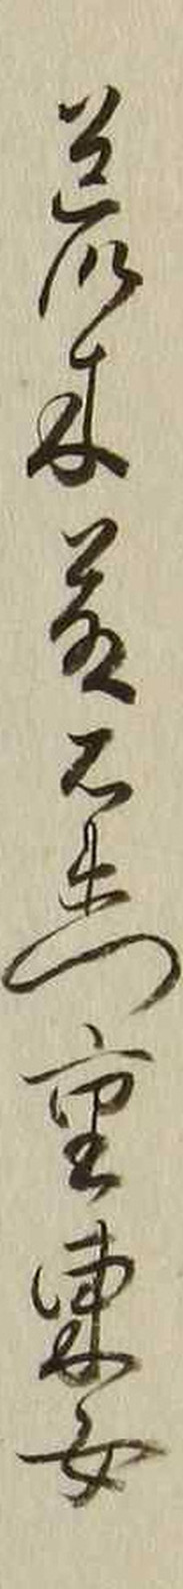荒木藤右衛門重東女
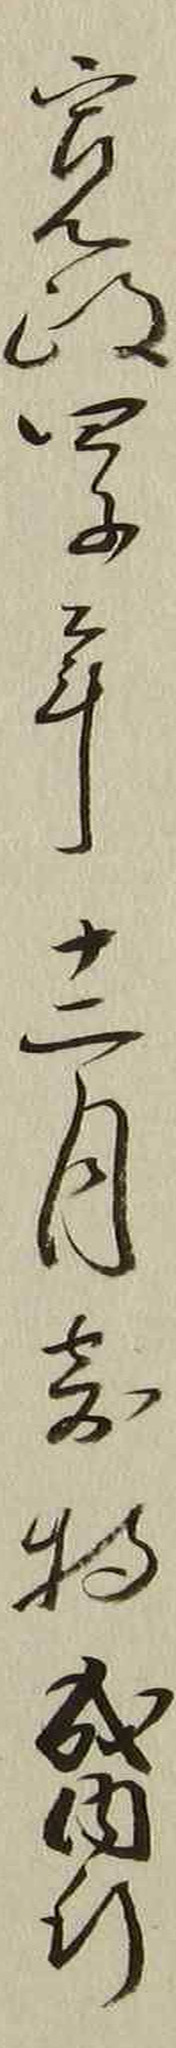寛政四子年十二月奇特成内行
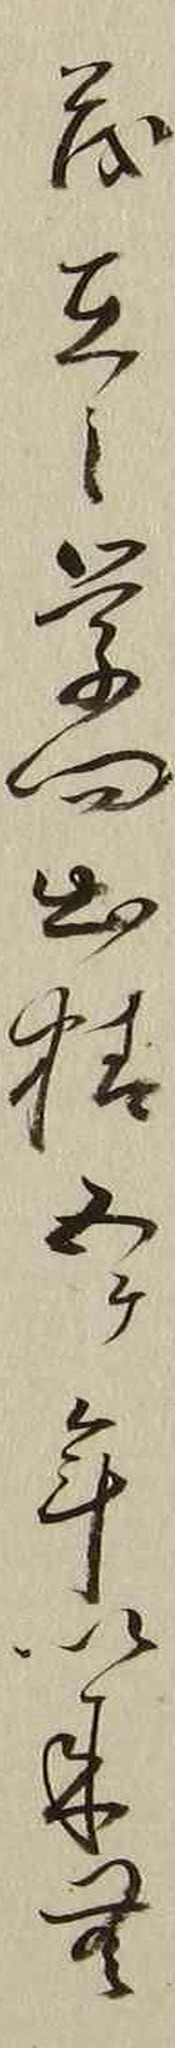茂在之学問出精五ヶ年以来無
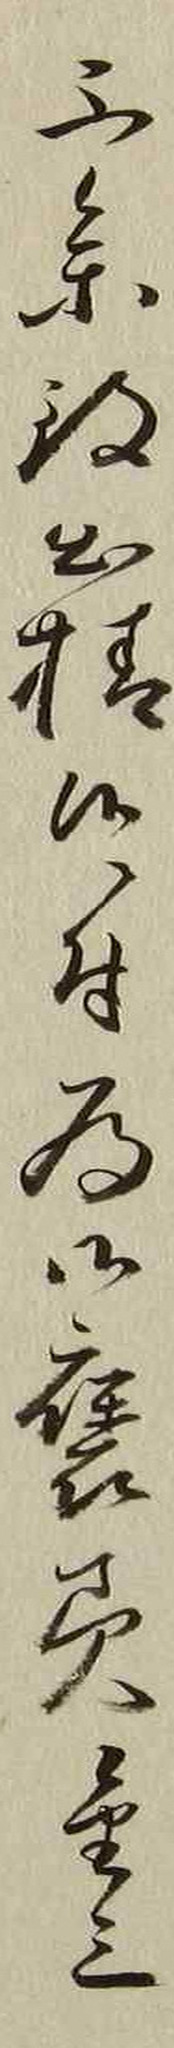不参役出精候ニ付為御褒美金三
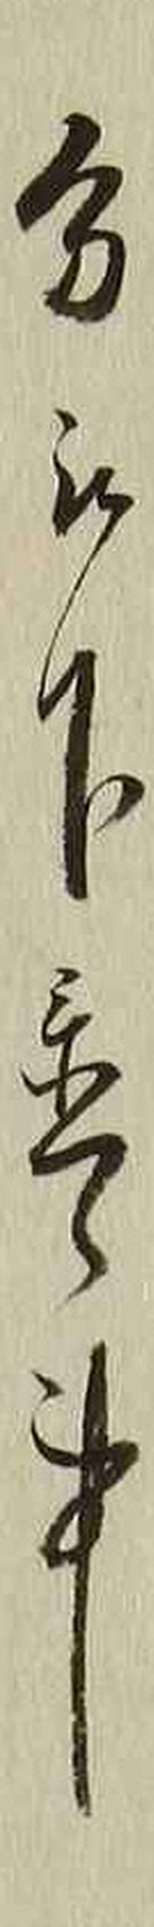分被下置候事
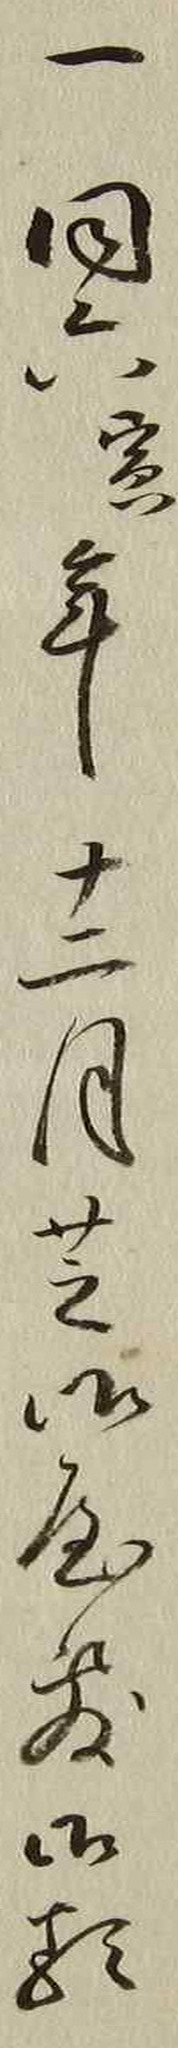一同六寅年十二月芝御屋敷御類
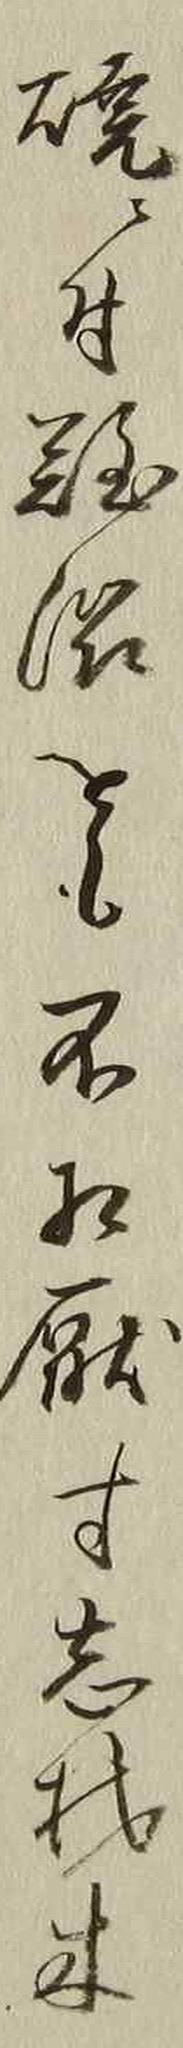焼ニ付難渋をも不相厭寸志材木
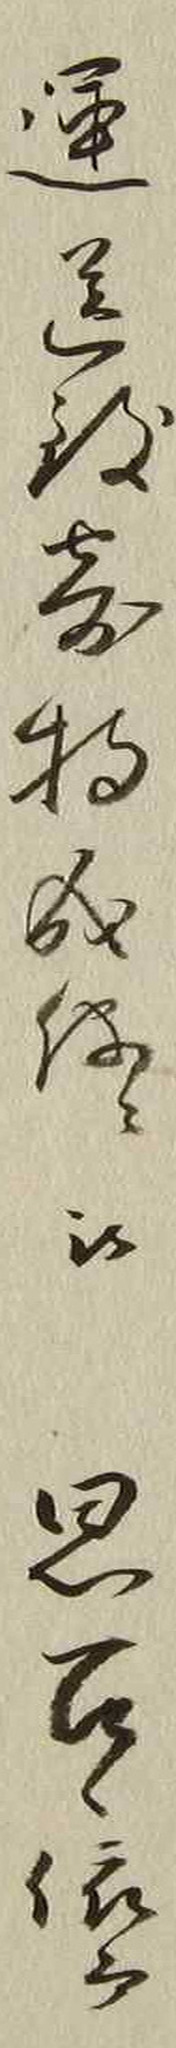運送致奇特成儀ニ被思召候依而
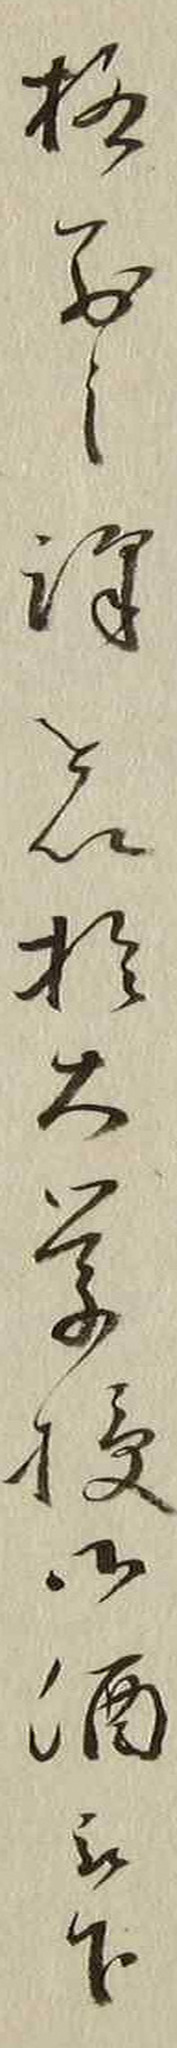格別之訳を以於大学校御酒被下
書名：諸士系譜　巻之52　に之部3
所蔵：会津若松市立会津図書館
